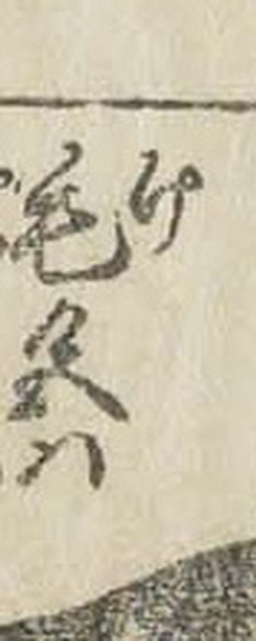毛色は
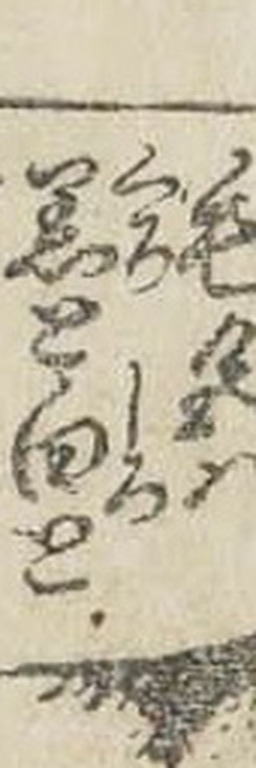黒と白と
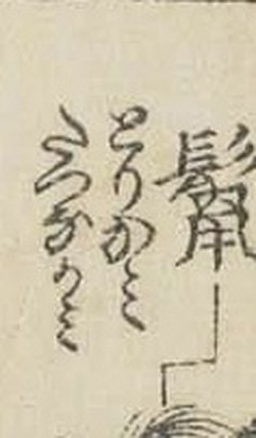とりかみ
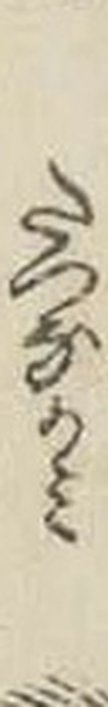たつなかみ
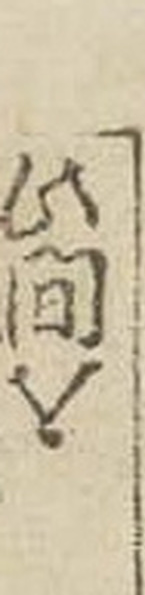此間を
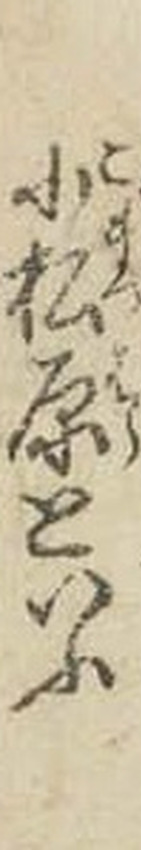小松原といふ
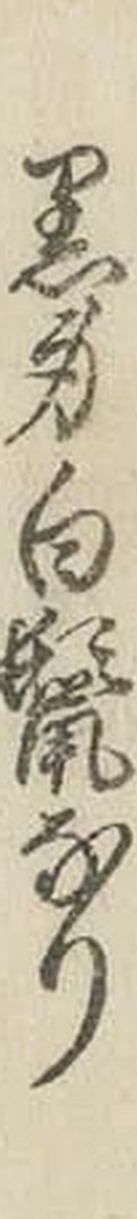雒黒身白鬣なり
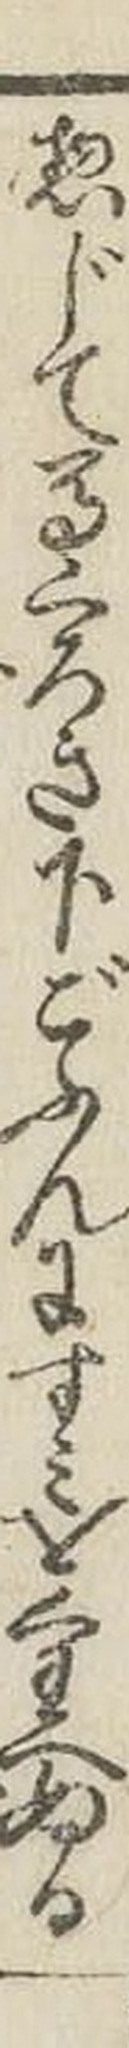総じて馬くろき下ごふんにすみをくわへぬる
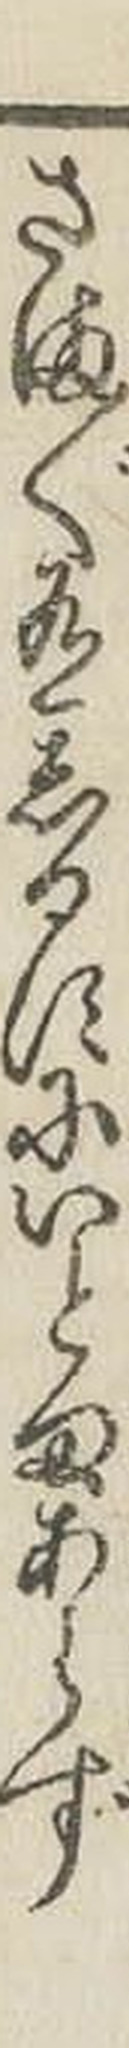さま〴〵有しるすにいとまあらず
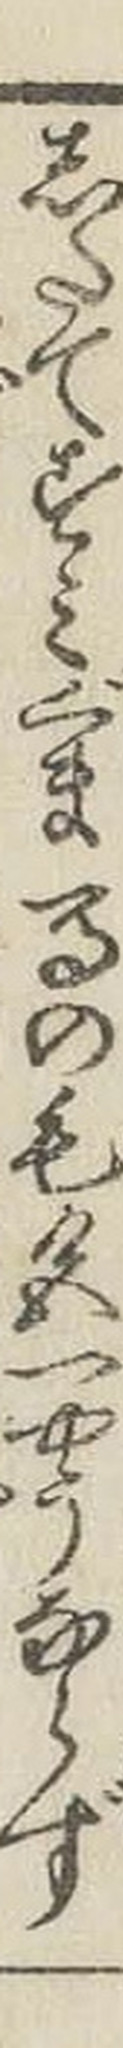したてすみぐま馬の毛色一やうならず
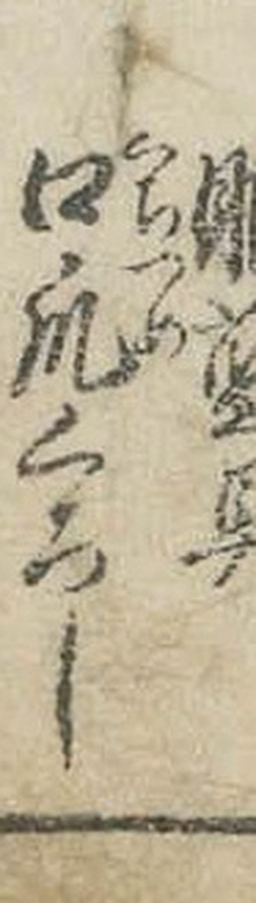口爪くろし
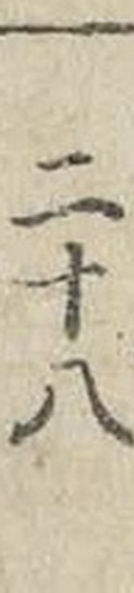二十八
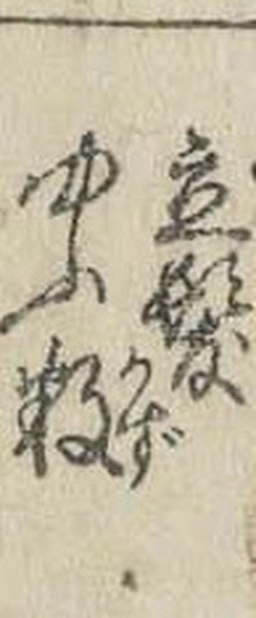ゆふ数
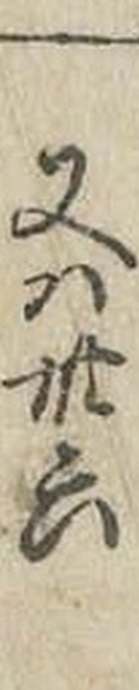又は卅六
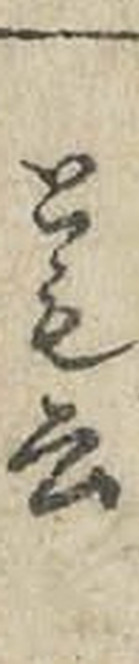とも云

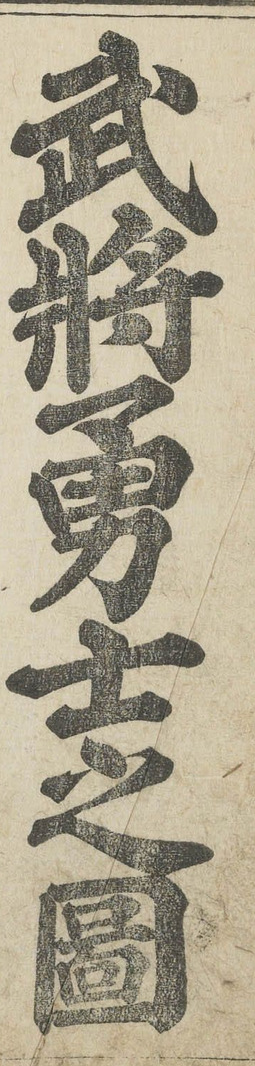武将勇士之図
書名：絵本写宝袋 9巻 2之巻
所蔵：東京学芸大学教育コンテンツアーカイブ
